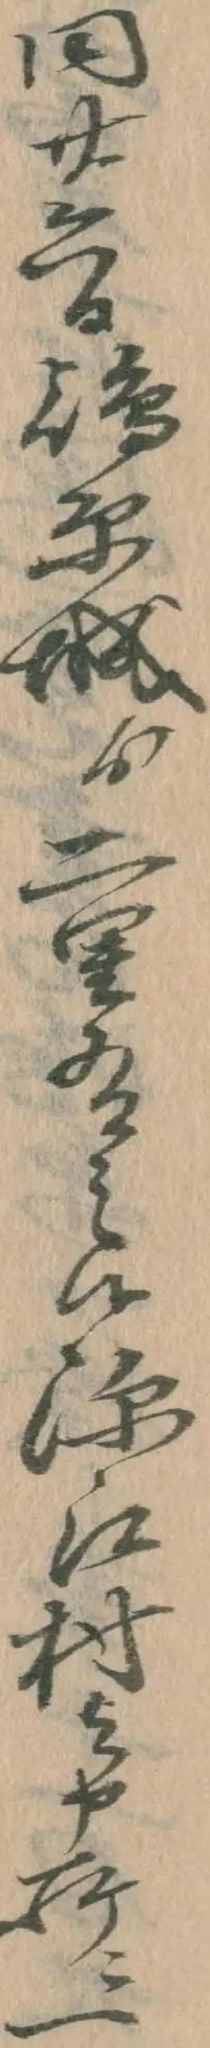同廿六日島原城ゟ二里有之候深江村与申所に一
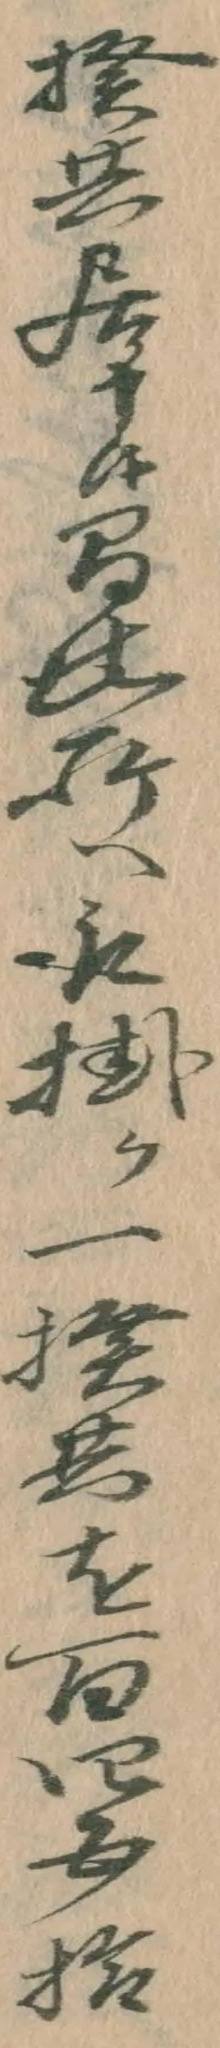揆共居申候間此所へ取掛け一揆共を百四五拾
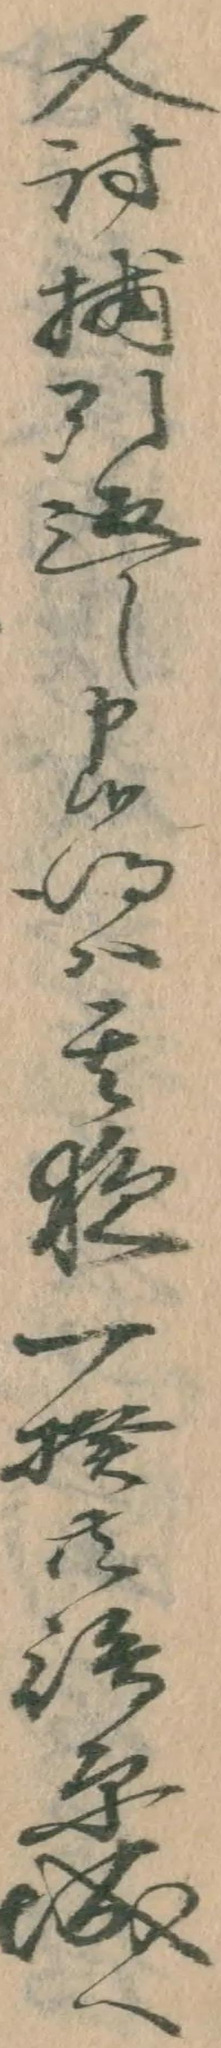人討捕引返し申候得は其夜一揆共島原城へ
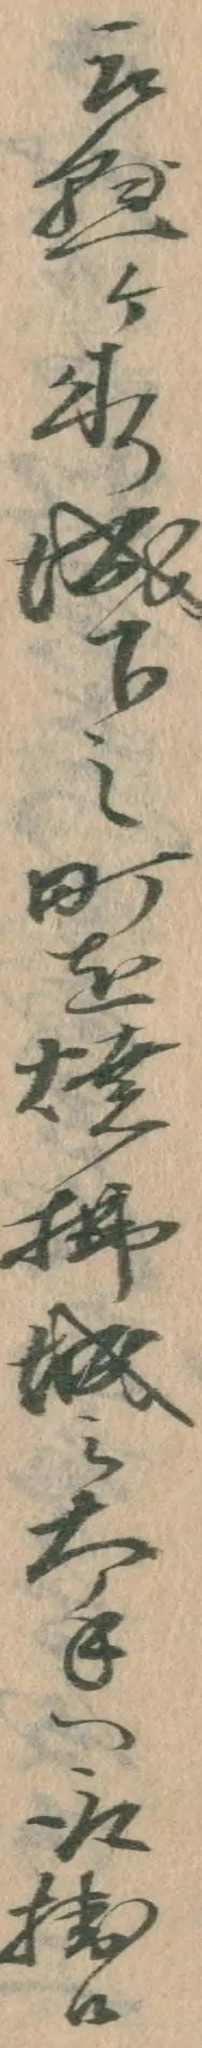取懸け来り城下之町を焼払城之大手へ取掛候
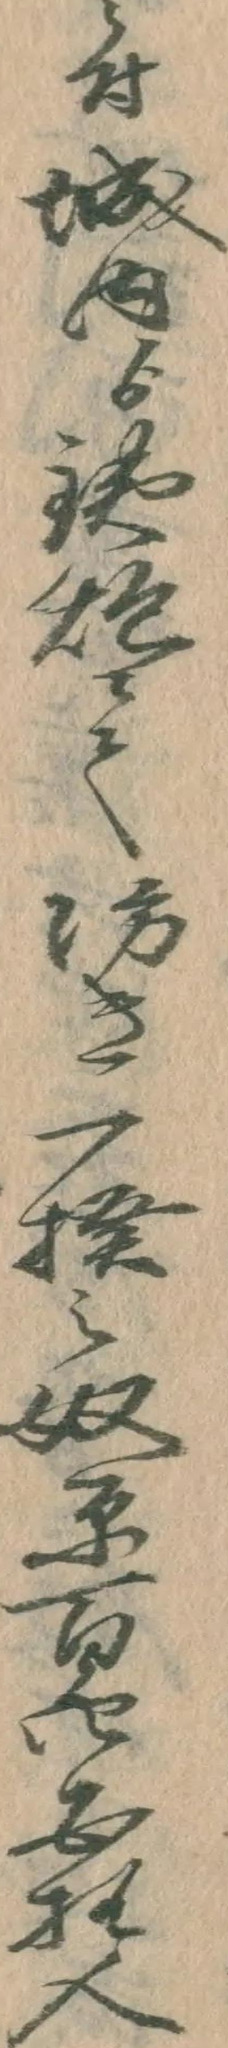に付城内ゟ鉄炮にて防き一揆之奴原百四五拾人
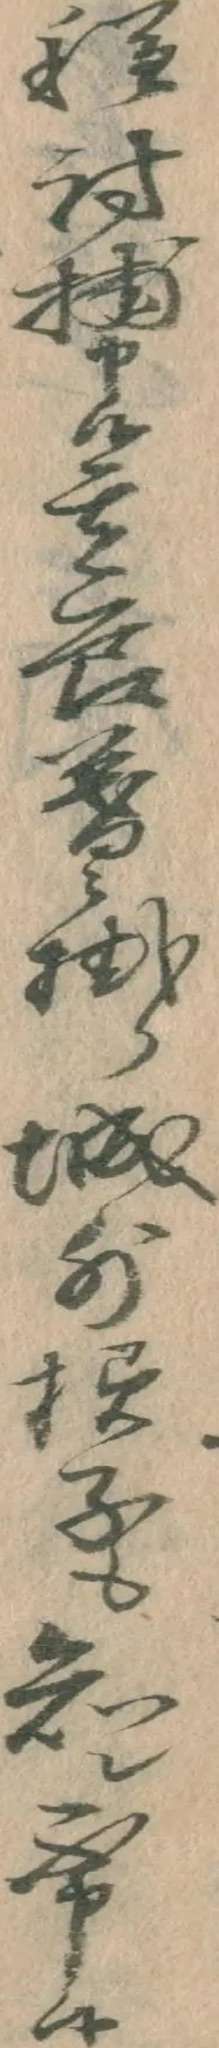程討捕申候其節暮に掛り城外様子も知れ不申候
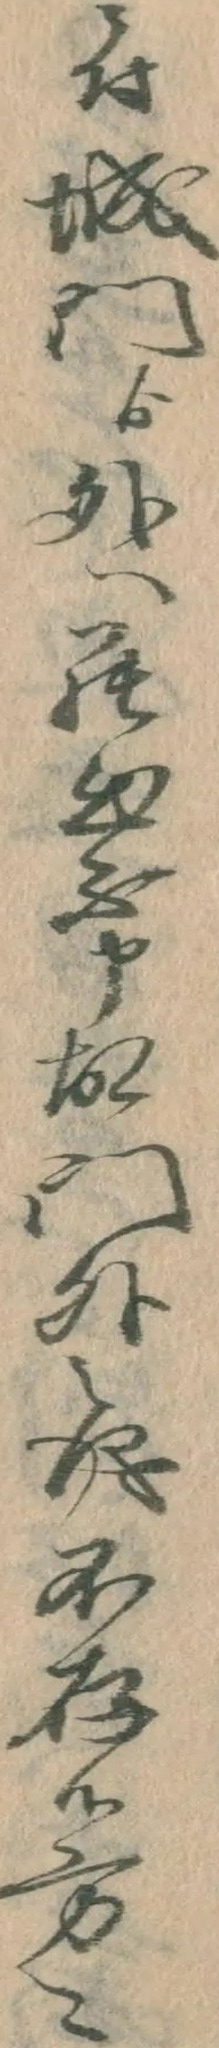に付城門ゟ外へ罷出不申故門外之儀不存候方々
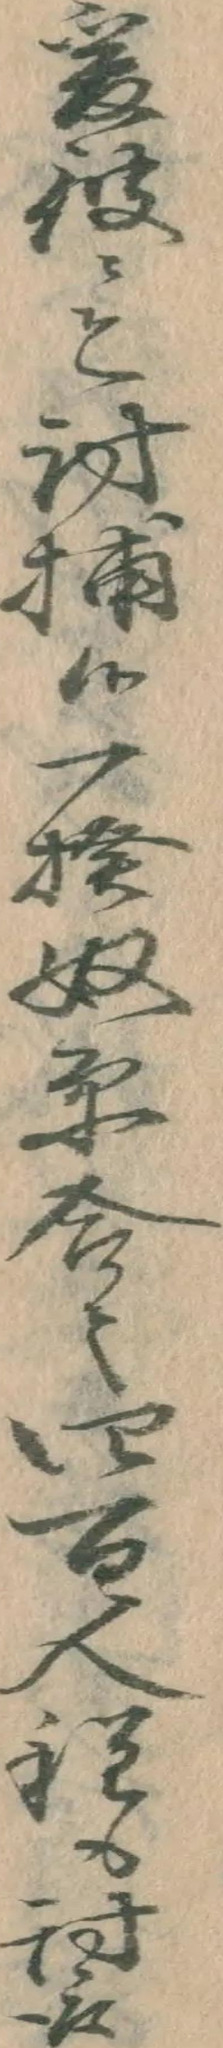爰彼にて討捕候一揆奴原合て四百人程も討取
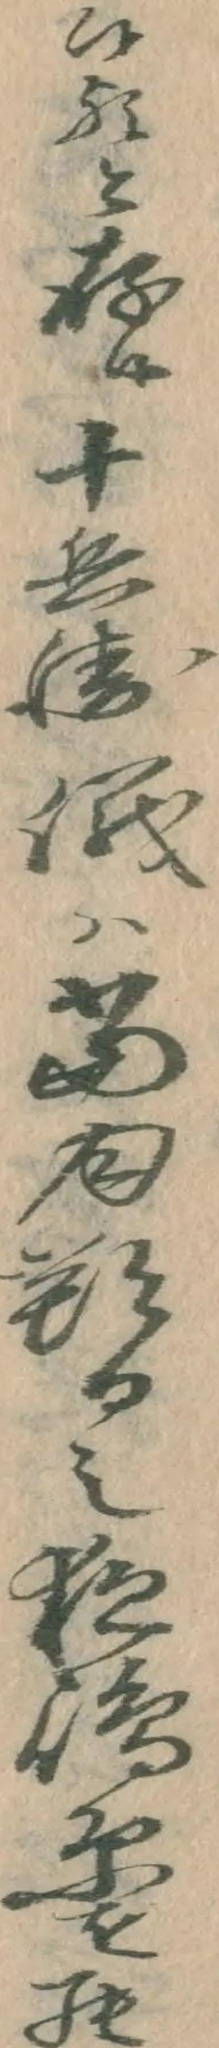候歟と存候十兵衛儀は当月朔日之夜島原を罷
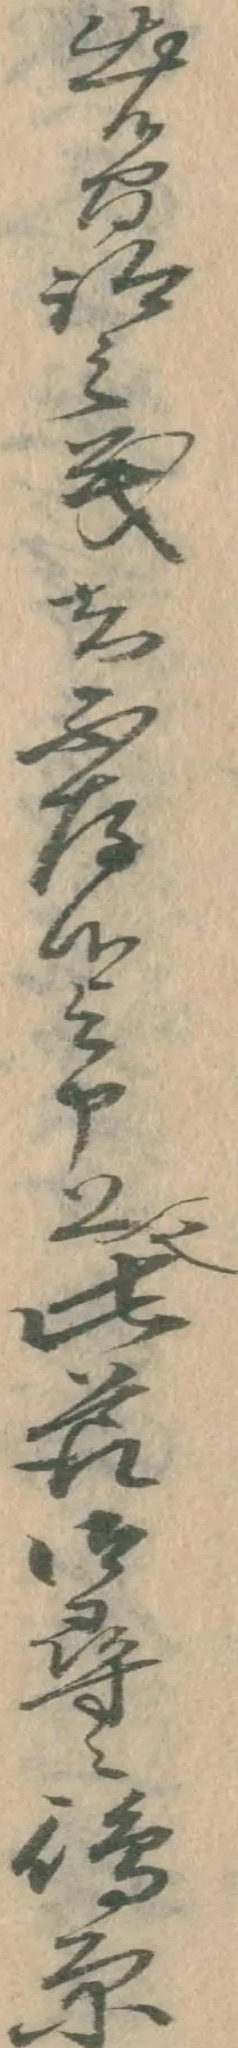出候間跡之義者不存候与申上也此節御尋之島原

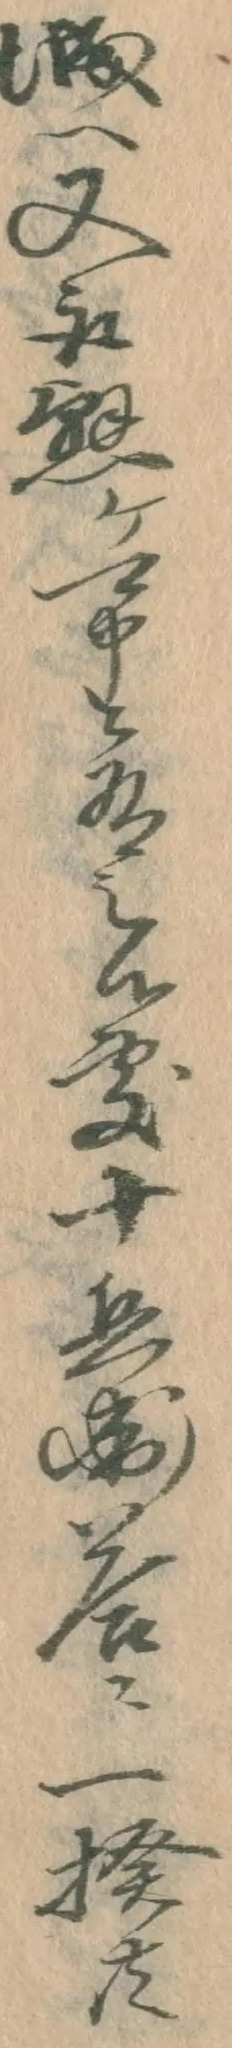城へ又取懸け可申と有之候處十兵衛答す一揆共
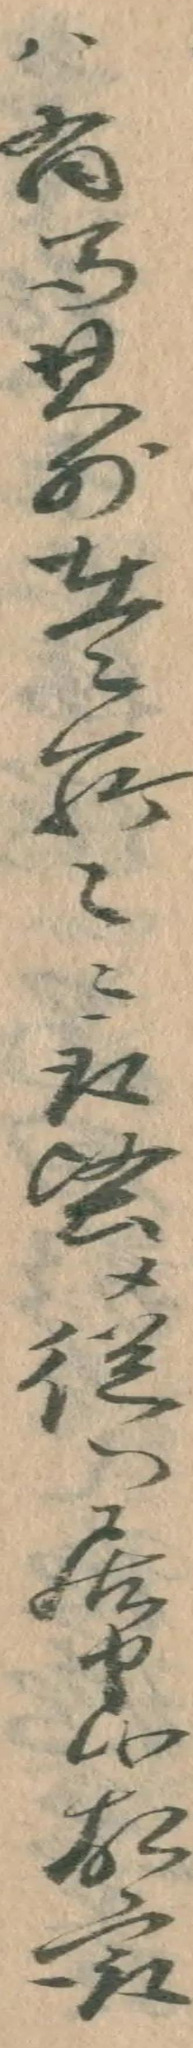は有馬其外在々所々に取堅め従へ居申候故最
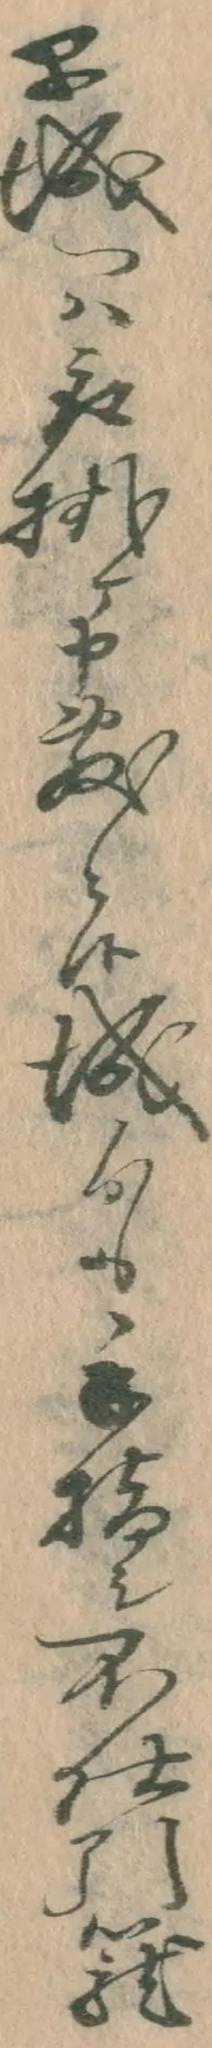早城へは取掛け申處に候城ゟも手指し不仕引籠
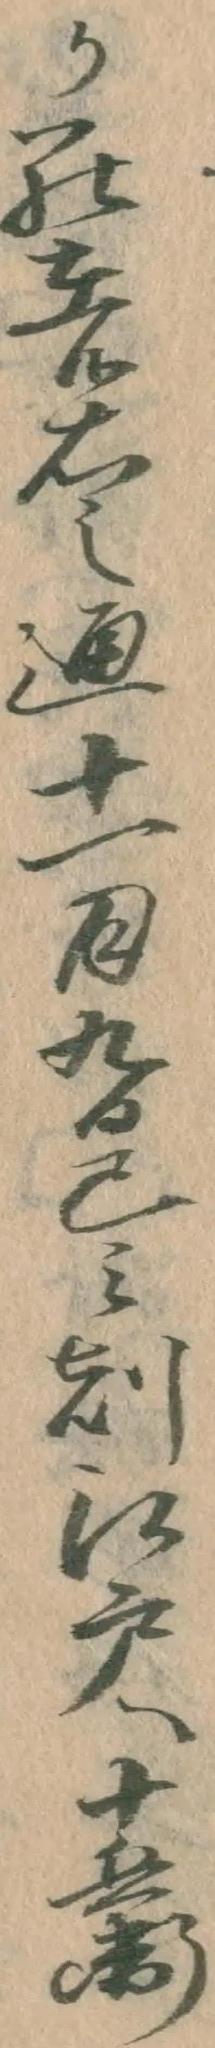り罷在候右之通十一月九日巳之刻江戸へ十兵衛
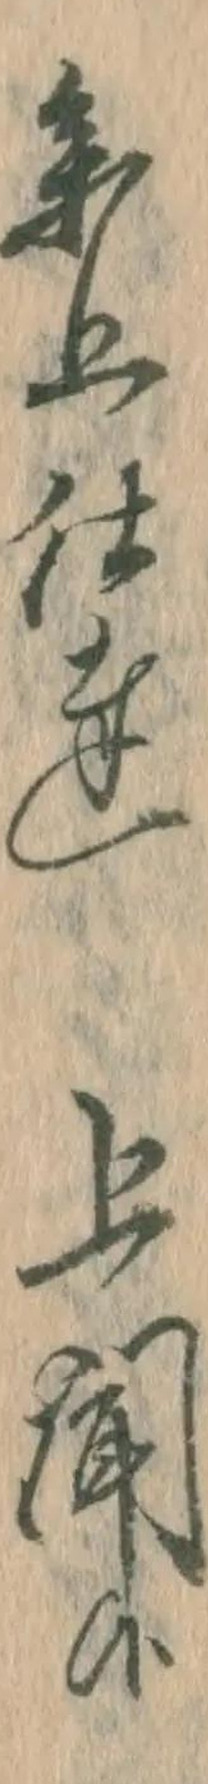参上子仕達上聞候
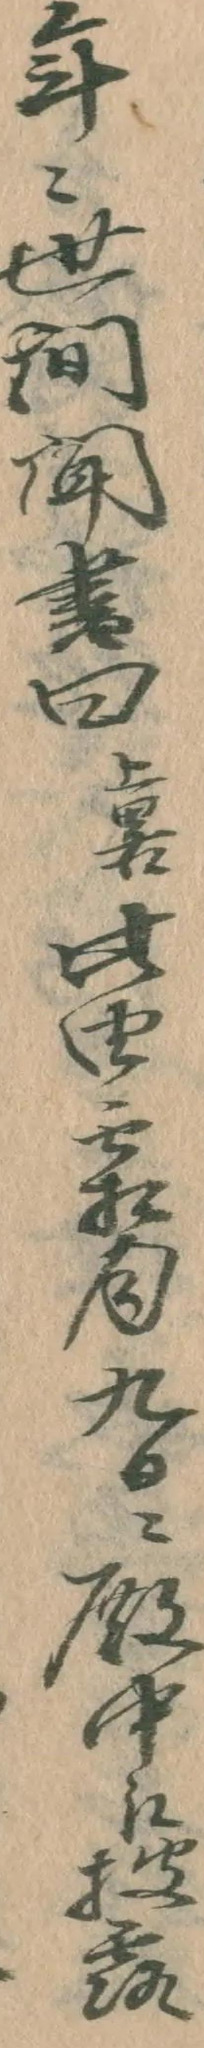年々世間書曰上田右此由霜月九日に殿中江披露
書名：切支丹御退治記 49巻. [2]
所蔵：国立国会図書館 National Diet Library, JAPAN
